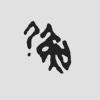{人魚}
